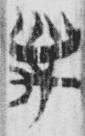萬（勵）
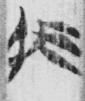於
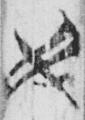民
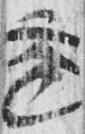而
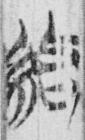○（治）
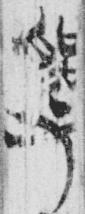○（亂）
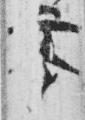不
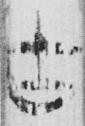古（故）
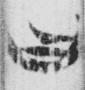曰
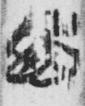臤
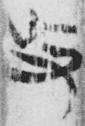及
